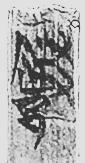{阜圭㕛邑}
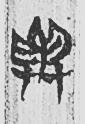與
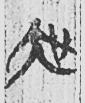吳
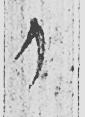人
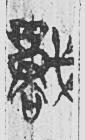戰
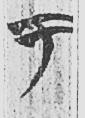于
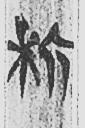析
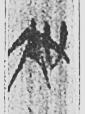吳
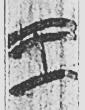王
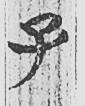子
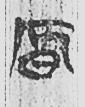晨
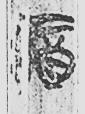𨟻
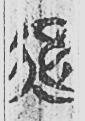起
